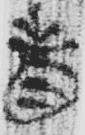眚（性）
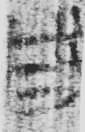或
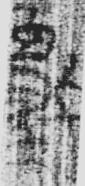○（動）
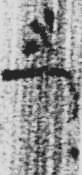之
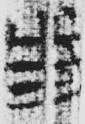或
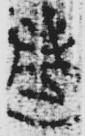逆
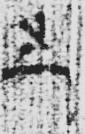之
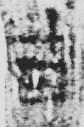或
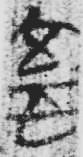○（實）
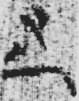之
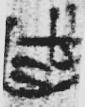或
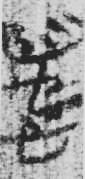○（厲）
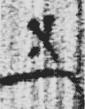之
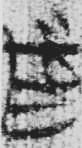或
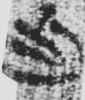出
